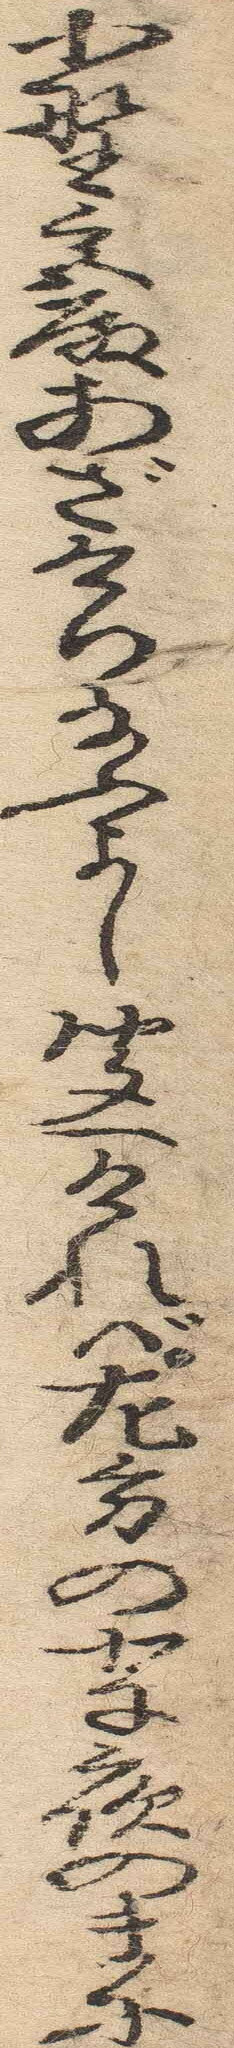小野宮殿あざけり給ふよし聞へければ。左方の輩夜のまに
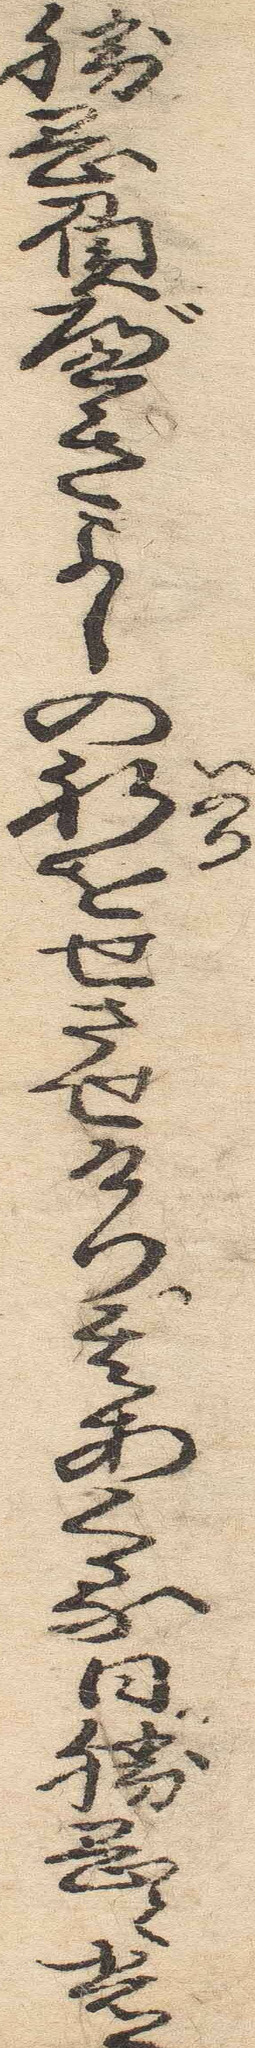勝岡負べきよしの祈をせさせけり。其あくる日勝岡と常
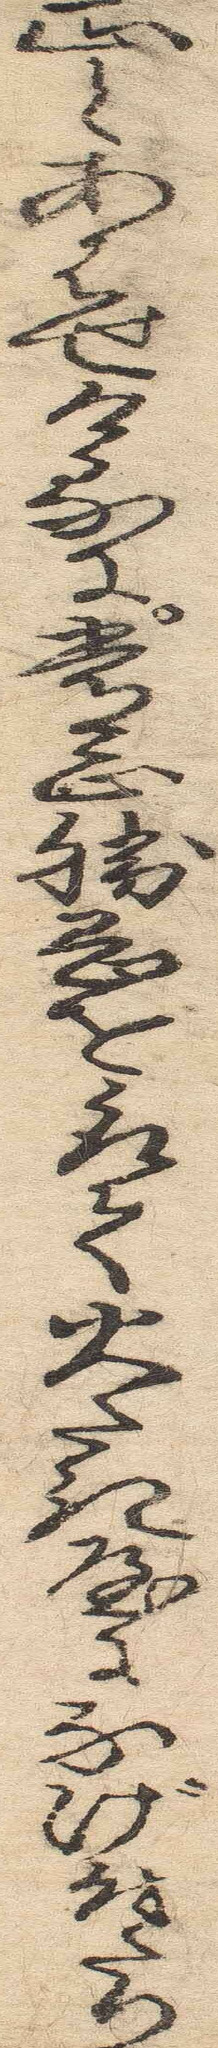正とあはせけるに。常正勝岡を取て火たきべになげ付たり
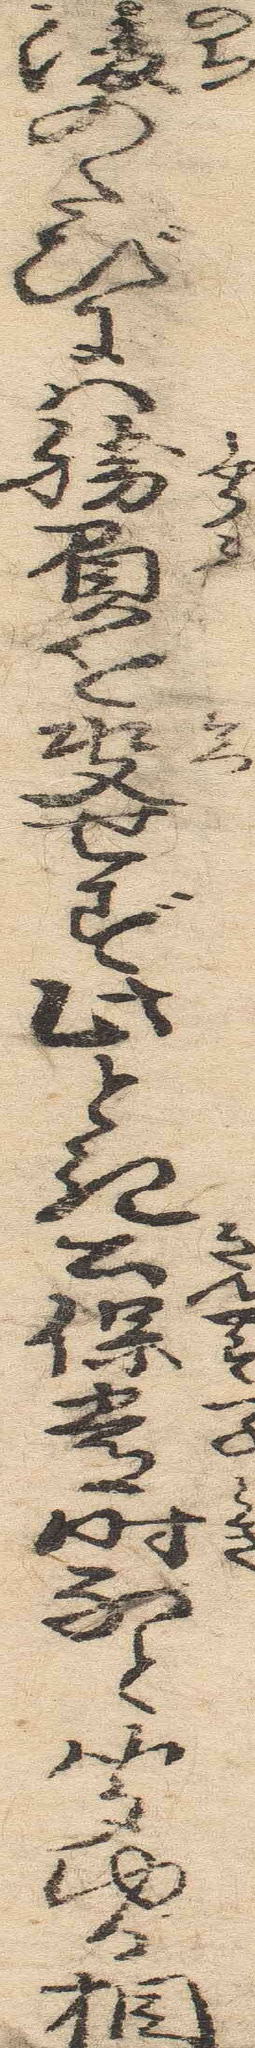後のたびには勝負を決せず此とき公保常時なと聞ゆる相
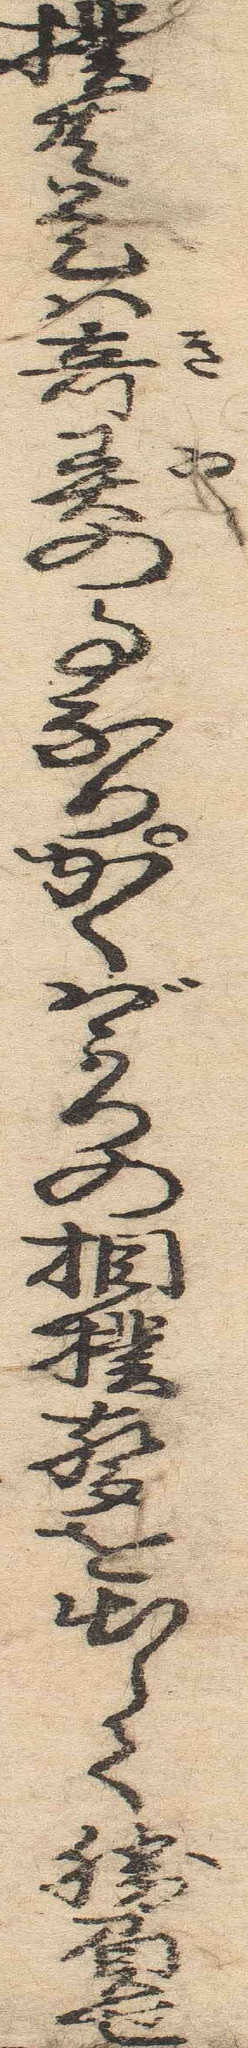撲共是は奇異の事なり。かくばかりの相撲声を出して勝負せ
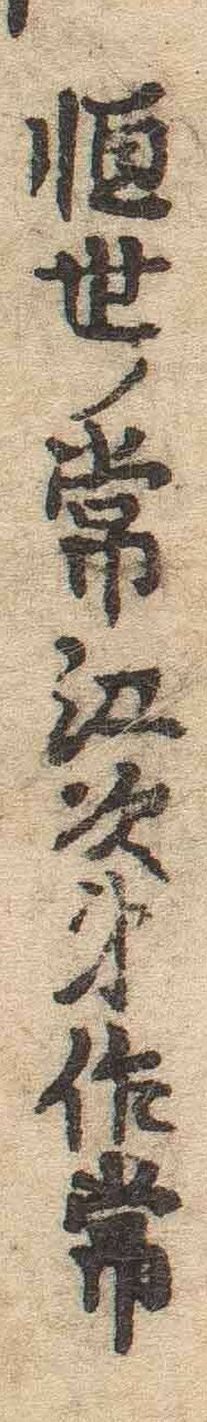常世ノ常江次第作常
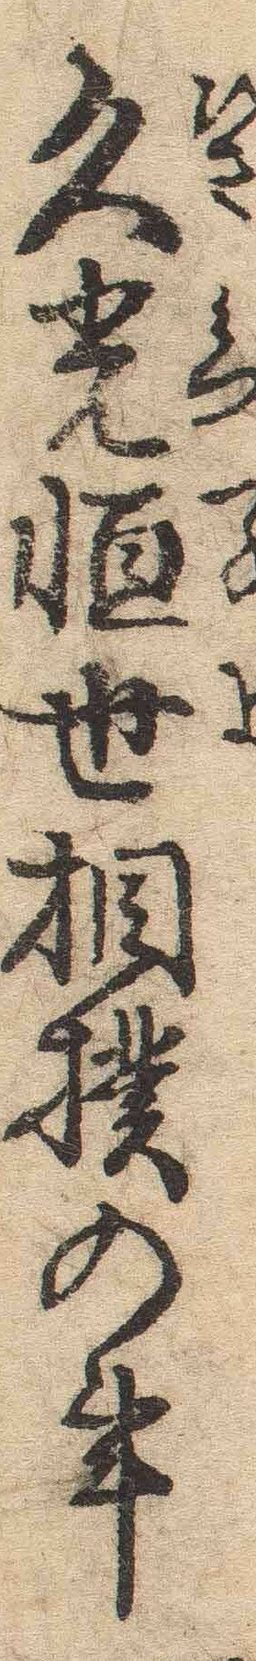久光恒世相撲の事
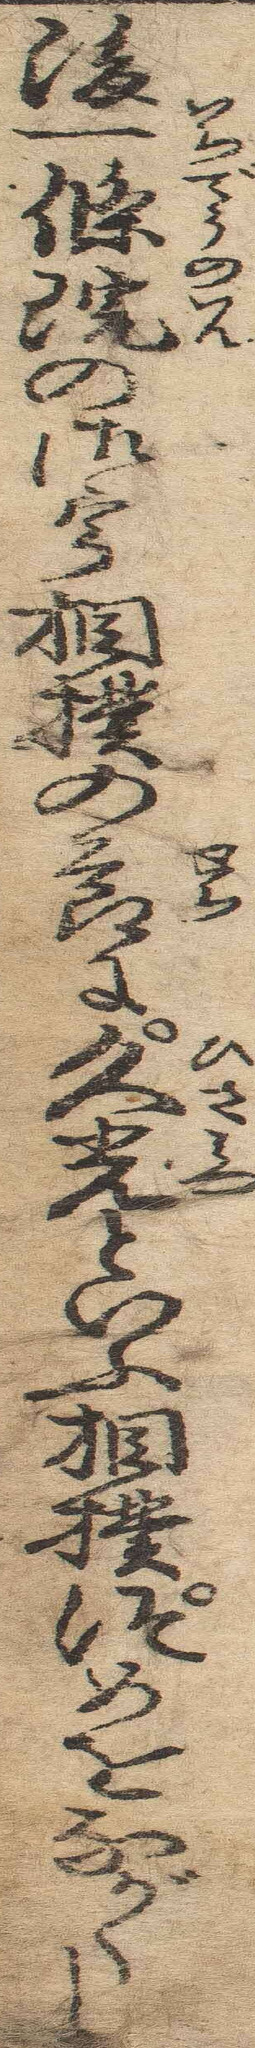後一條院の御宇相撲の節に。久光といふ相撲。つめをながくし

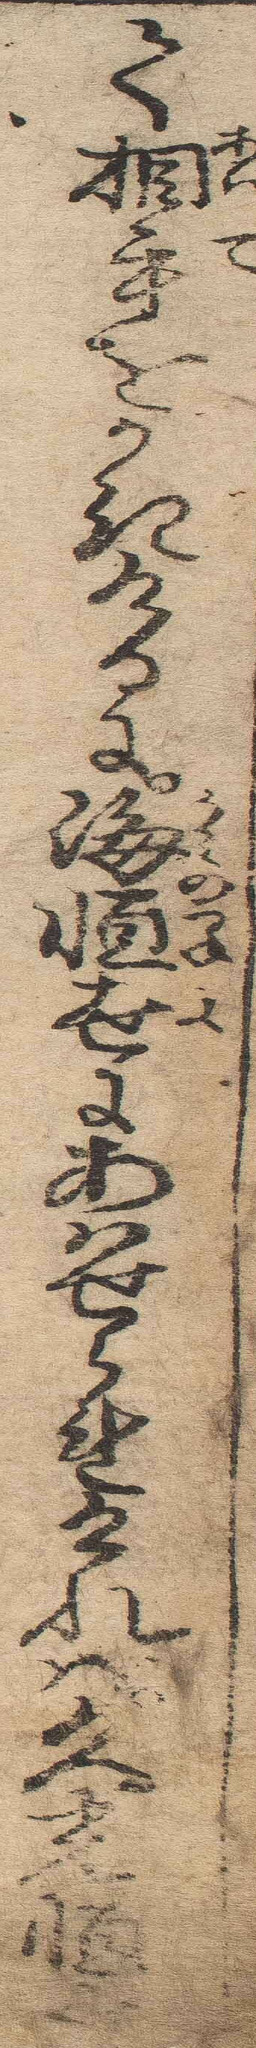て相手をかきけるに。海恒世にあはせられければ。久光恒世
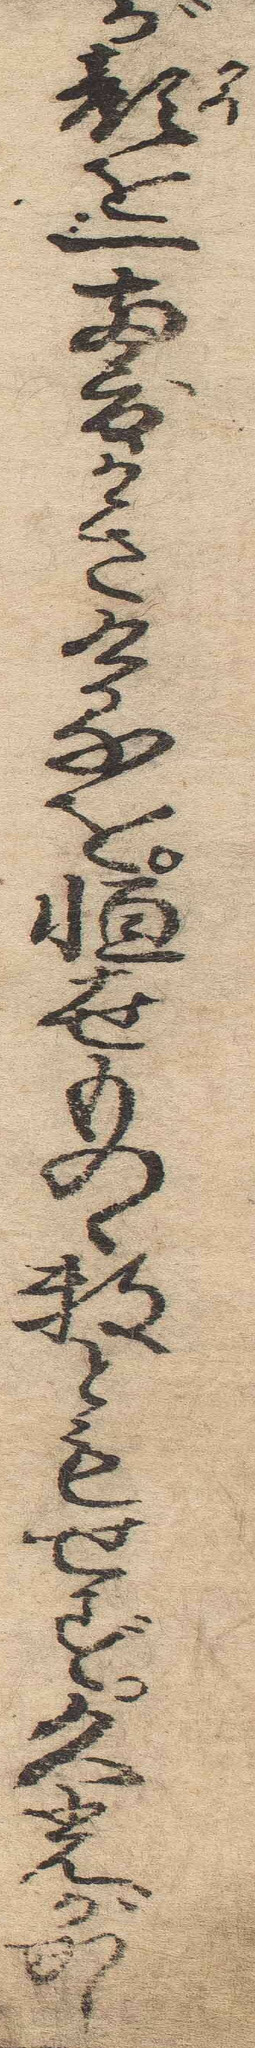が顔を一両度かきけるを。恒世ものゝ数ともせず。久光がかし
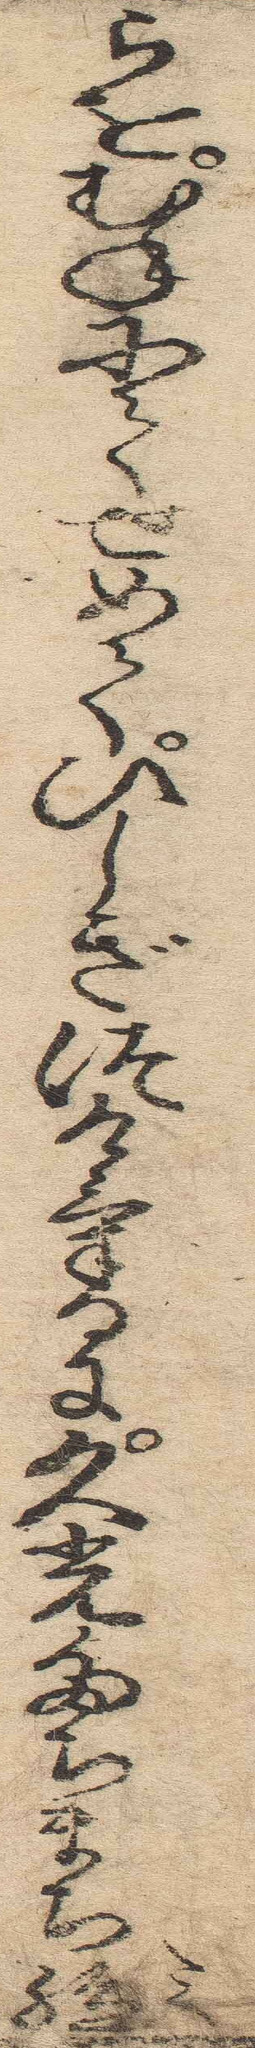らをむねにてせめて。ひしぎつけ奉るに。久光たちまち絶
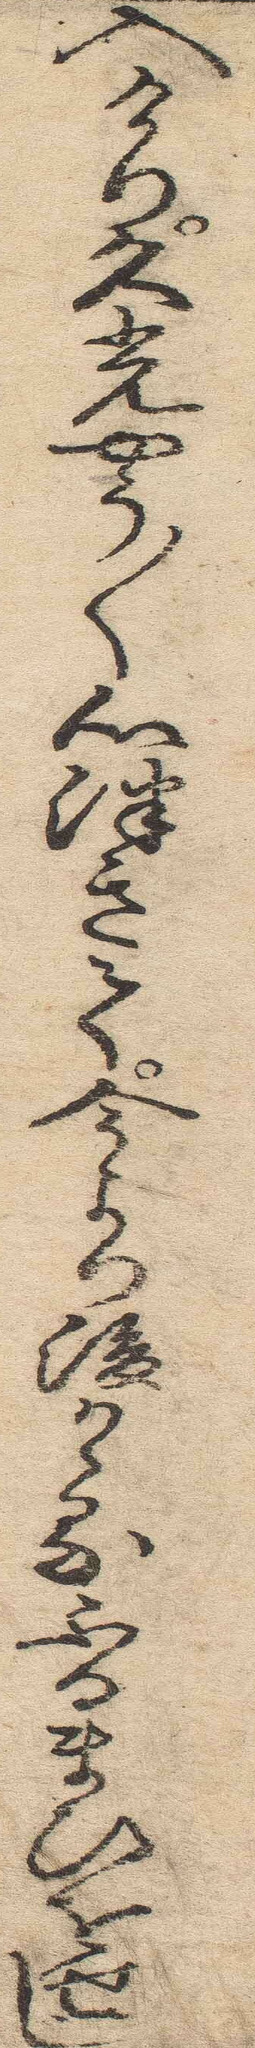入けり。久光やう〳〵心つきて。今より後かゝるふるまひをせし
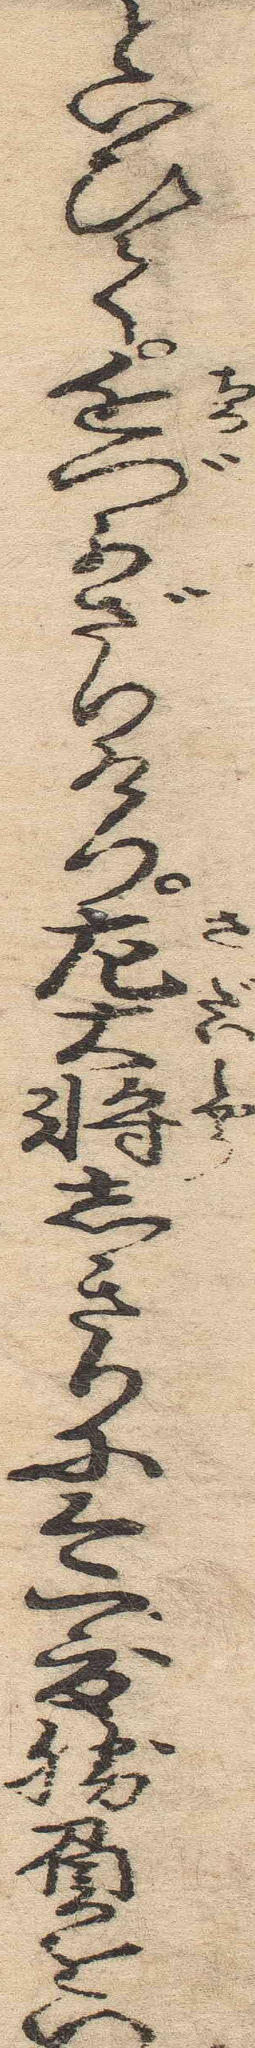といひて。近づかざりけり。左大将しきりに今度勝負をい
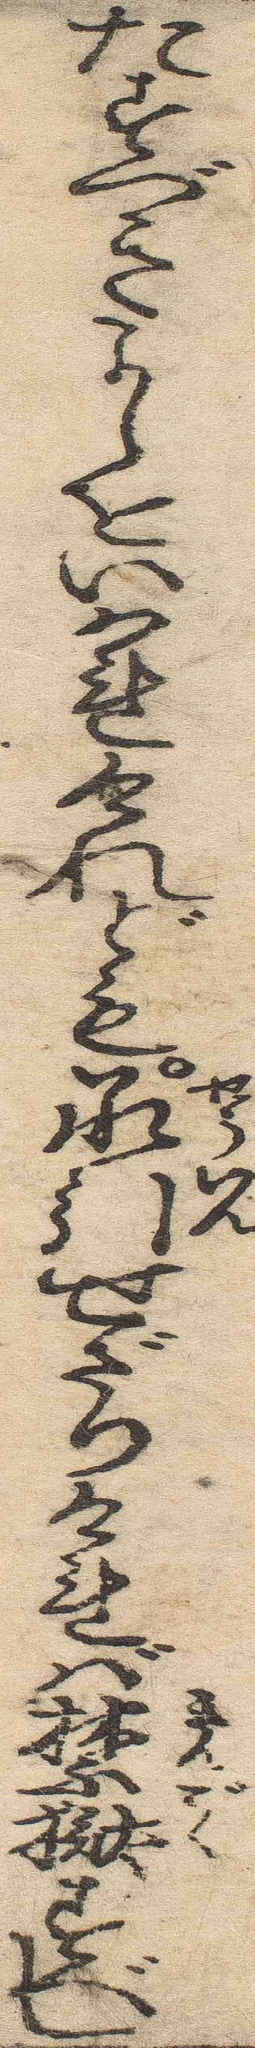たすべきよしをいはれけれども。承引せざりければ。禁獄すべし
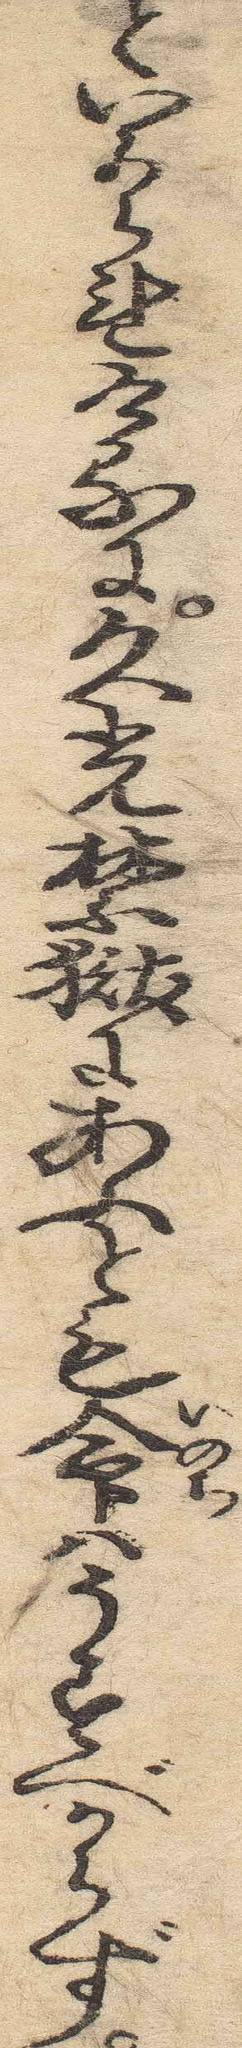といはれけるに。久光禁獄にあふとも命はうすべからず。
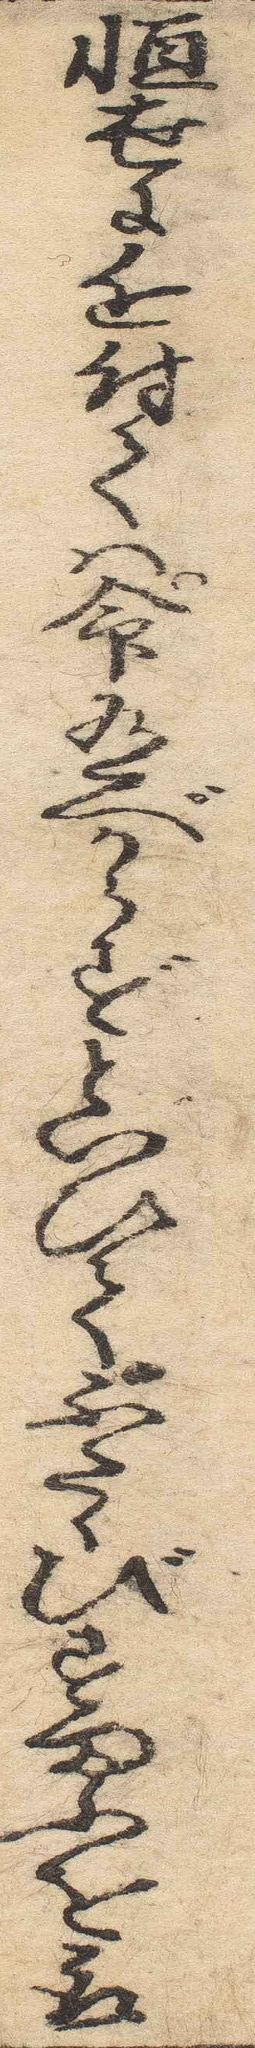恒世に近付ては。命有べからずといひて。ふたゝびすまふを取
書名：古今相撲大全
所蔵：東京学芸大学附属図書館 国文学研究資料館
